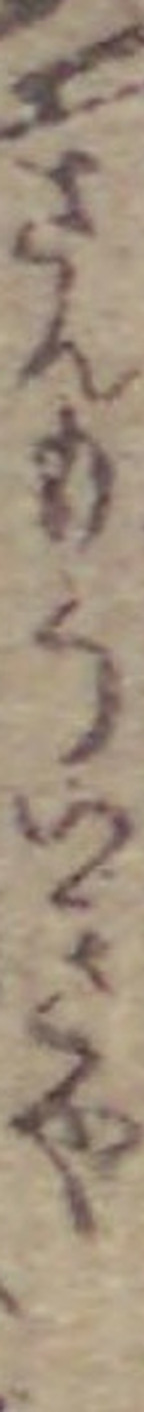さんもういきや
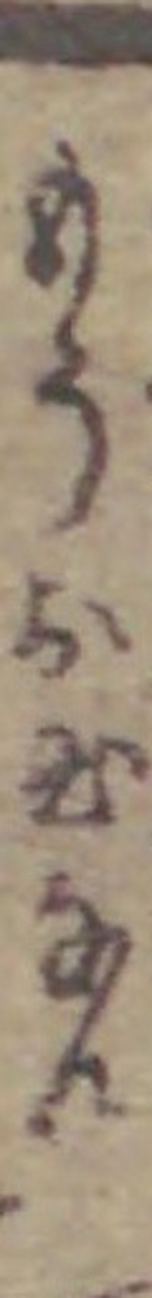もうお出なん
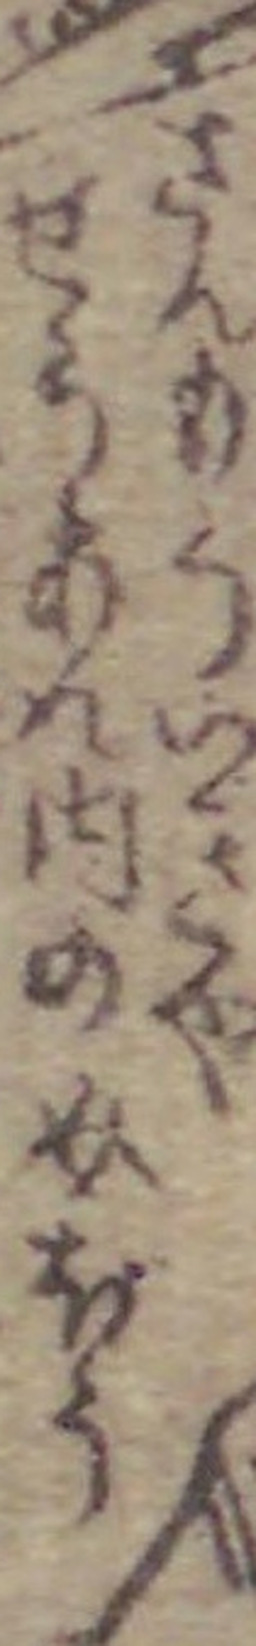せうあん内の女ぼう
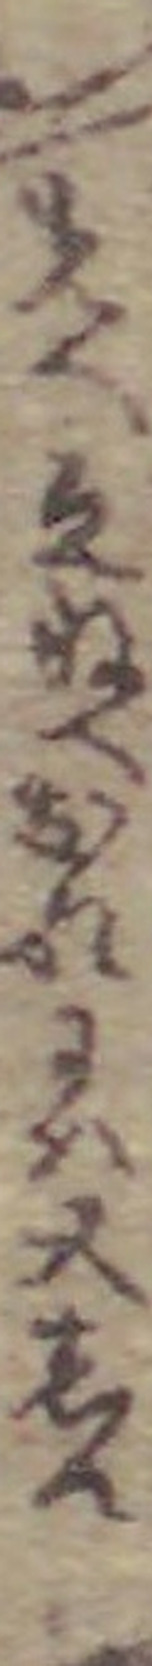先へ立ねへおれには又しん
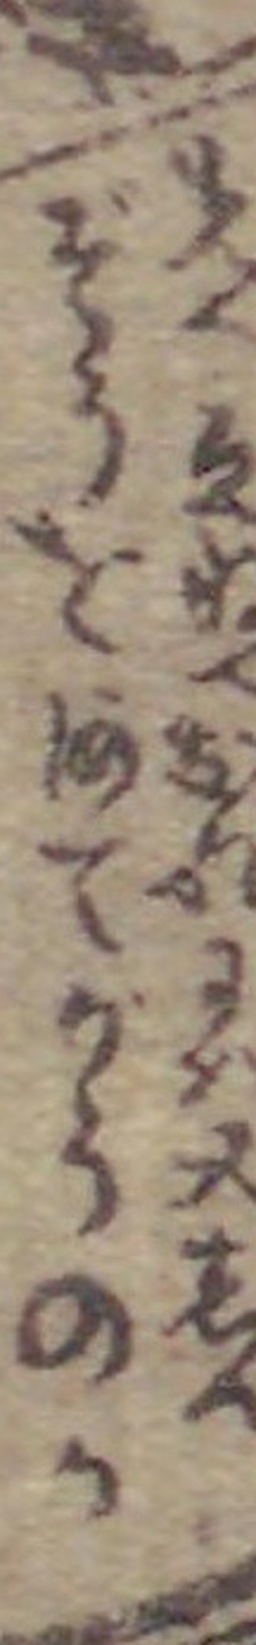ぞうをあてがうのか

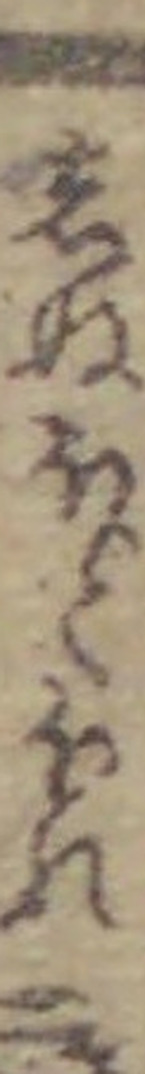しぬほとほれ
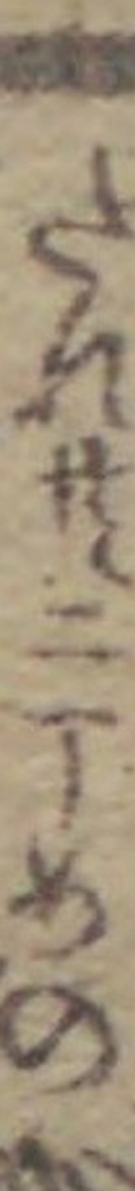たれ共二丁めの
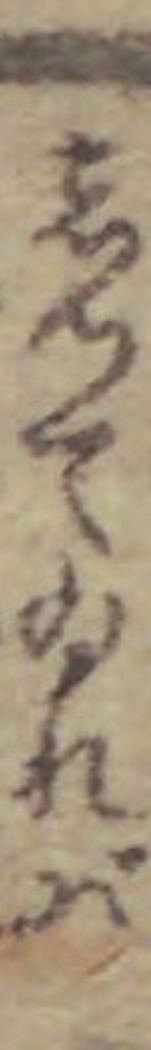しつてゐれば
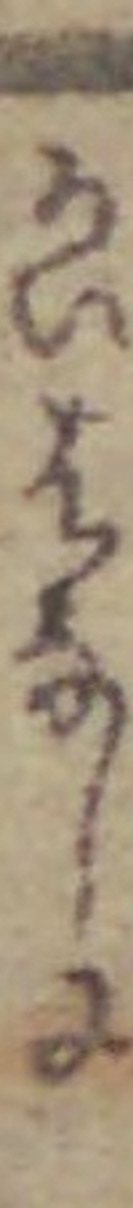かいはなしに
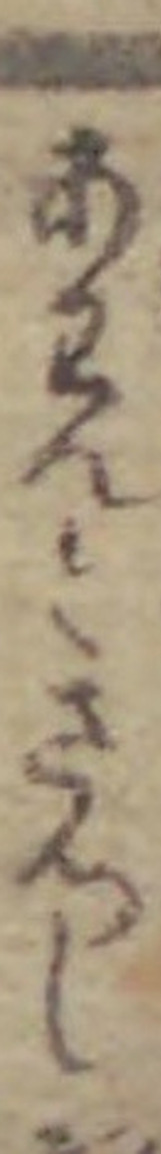あわんとさつし
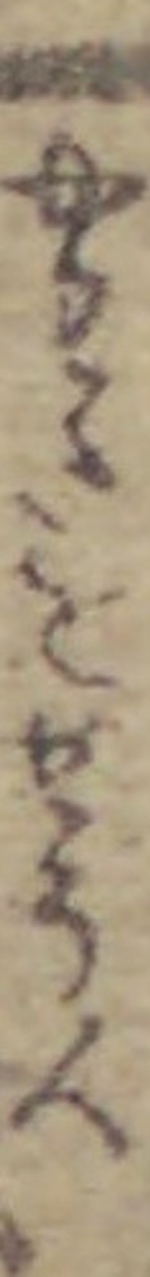やわたをせう人
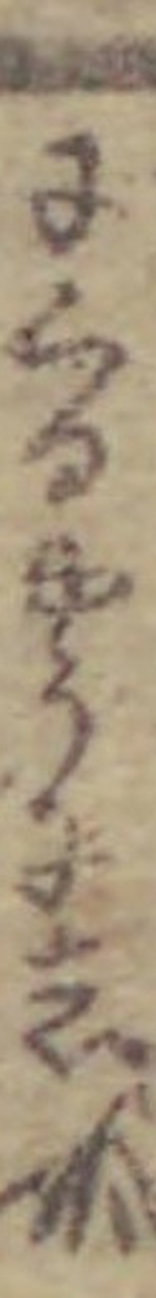にくるやうにし
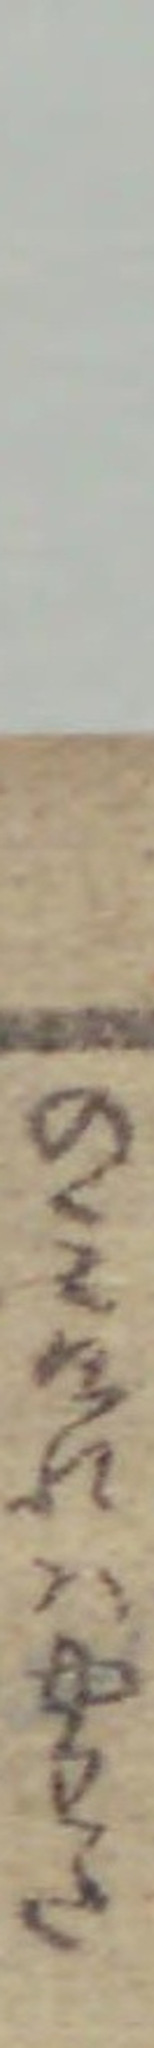のみけれはやわた
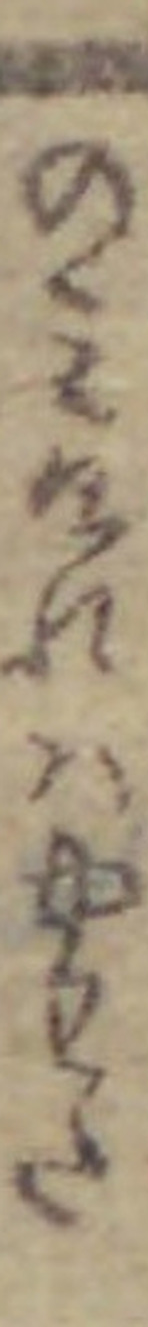のみけれはやわた
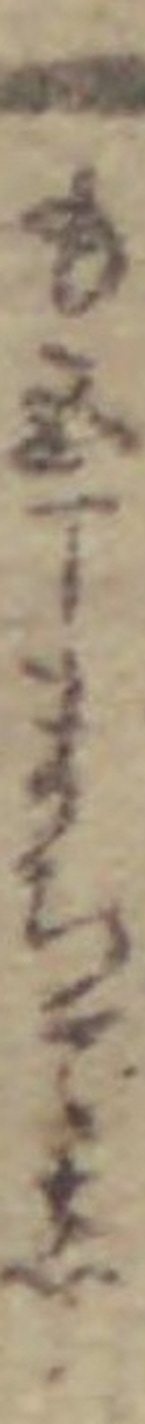も五丁まちてし
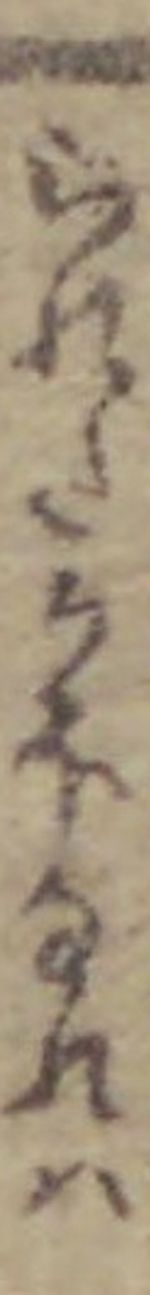られたかほなれは
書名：間似合嘘言曽我 3巻
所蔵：国立国会図書館 National Diet Library, JAPAN
